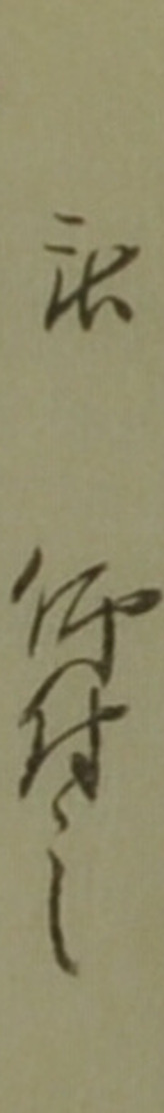被仰付之
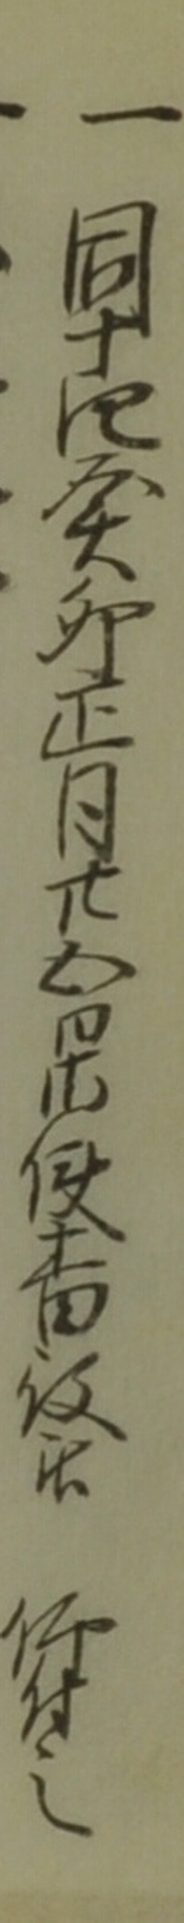一同十四癸卯正月廿五日御使番被仰付之
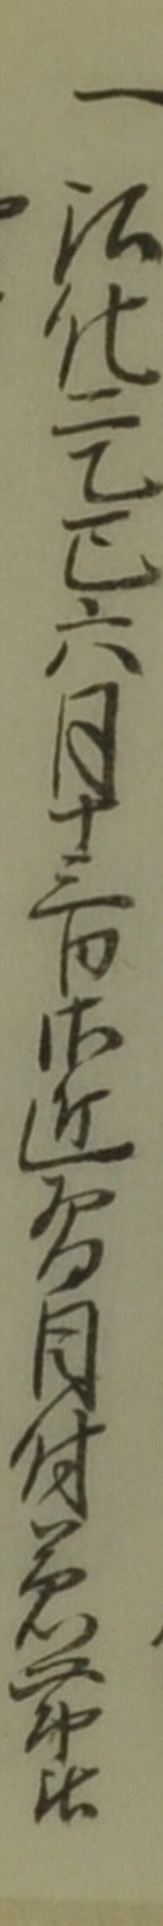一弘化二乙巳六月十三日御近習目付兼帯被
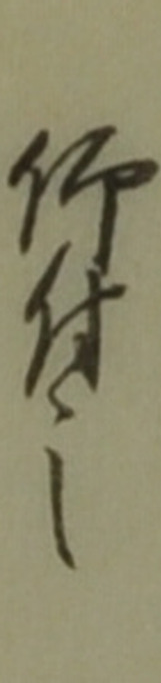仰付之
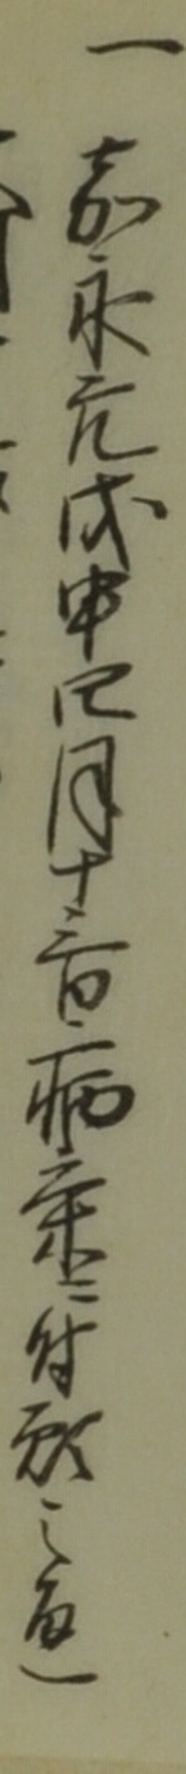一嘉永元戊申四月十三日病気ニ付願之通
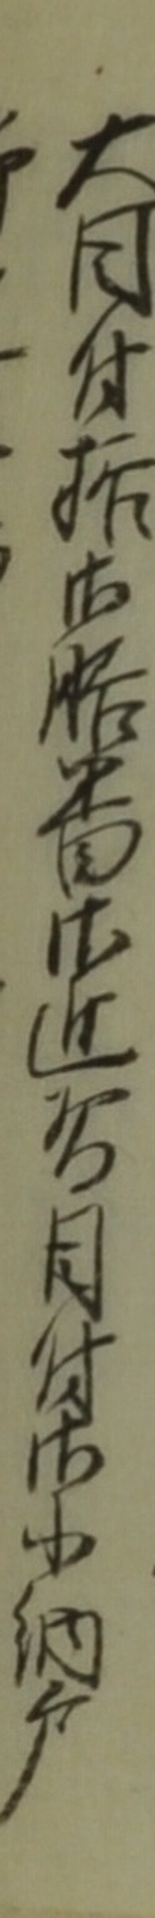大目付格御膳番御近習目付御小納戸
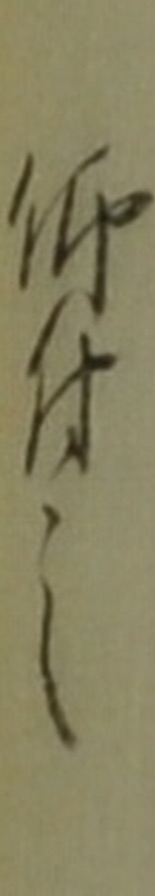仰付之
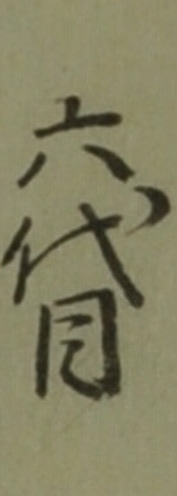六代目
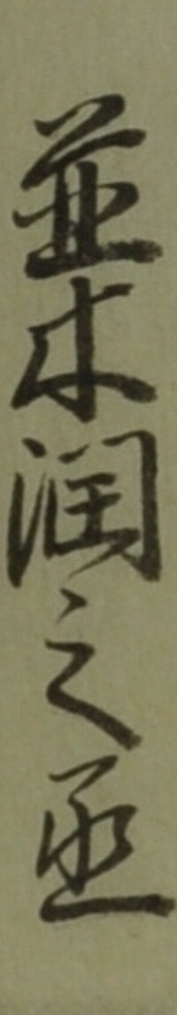並木潤之丞
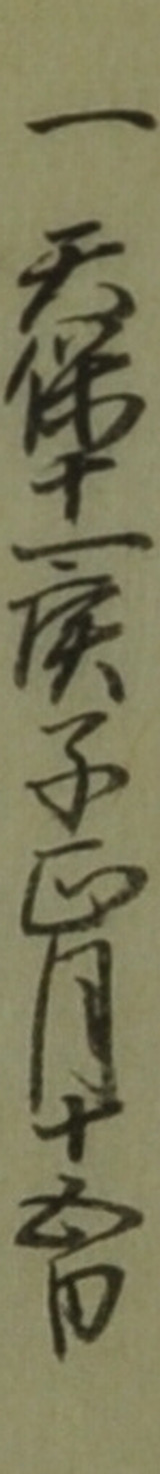一天保十一庚子正月十五日
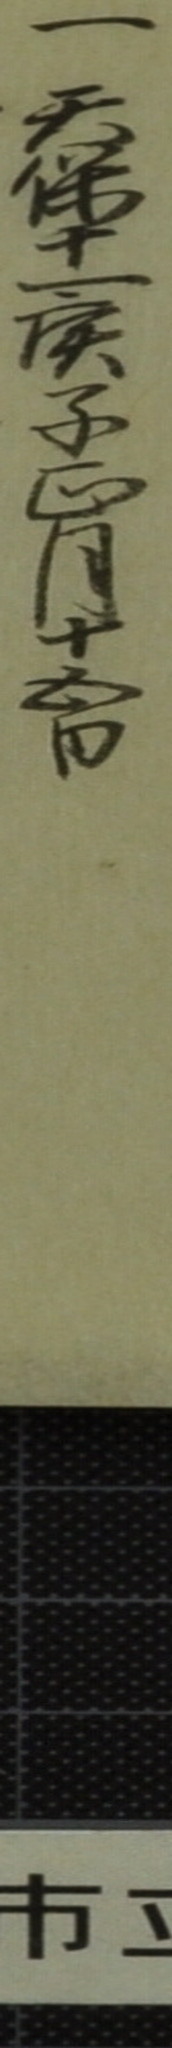一天保十一庚子正月十五日
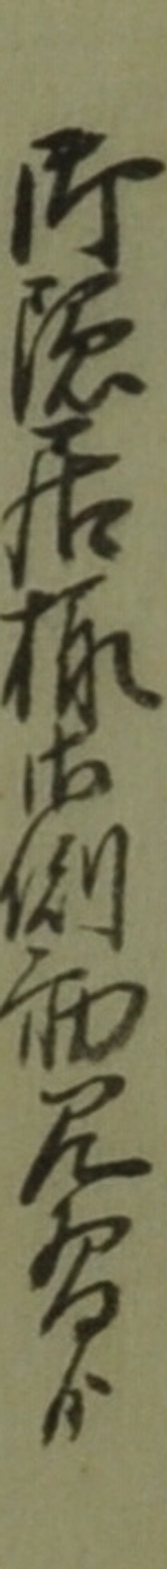御隠居様御側勤見習ゟ
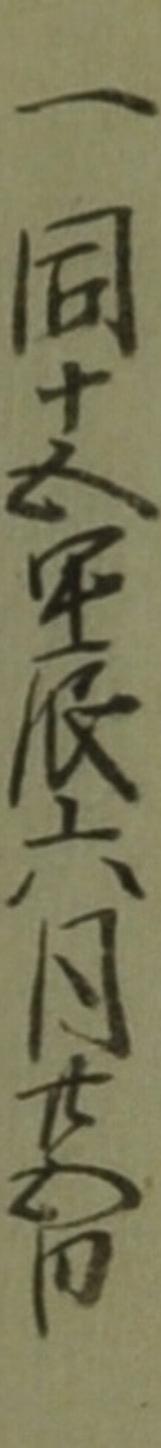一同十五甲辰六月廿五日
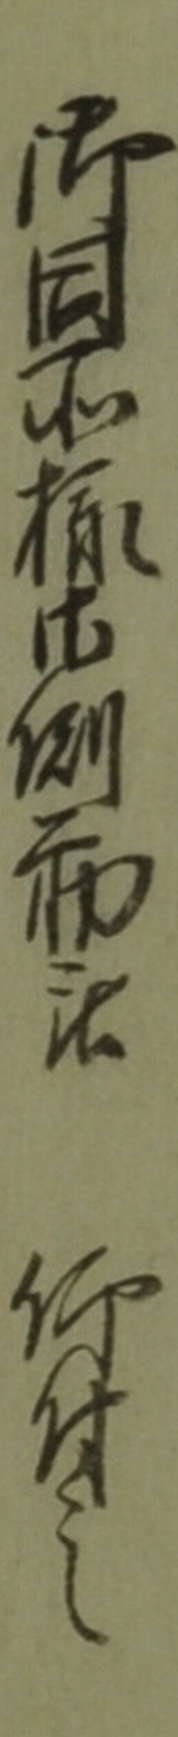御同所様御側勤被仰付之
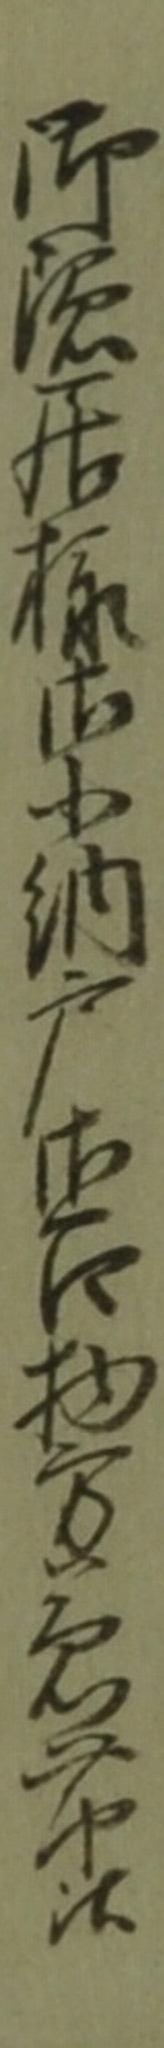御隠居様御小納戸御召物方兼帯被
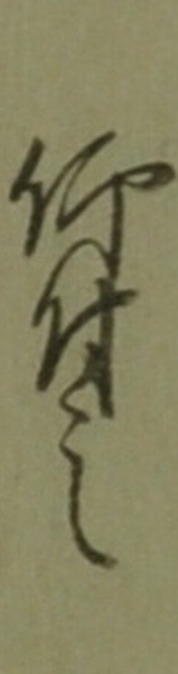仰付之
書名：諸御役代々録（五）
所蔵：伊那市立高遠町図書館・合同会社AMANE
